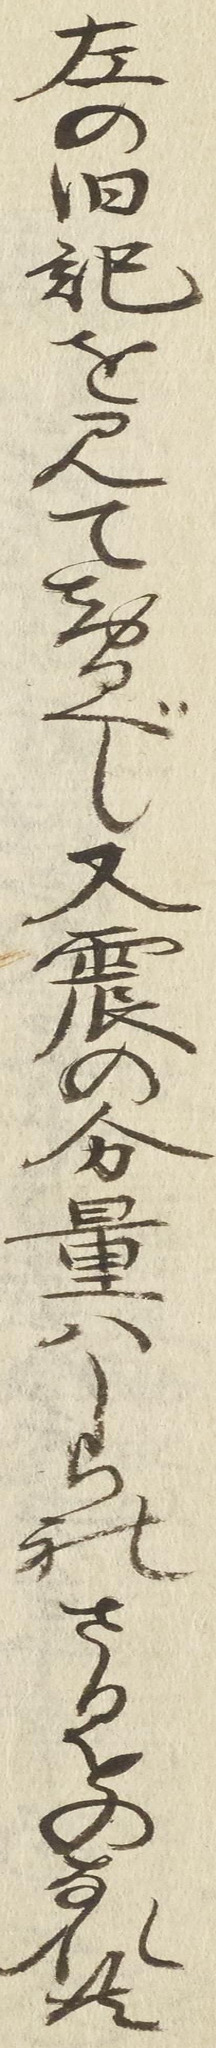左の旧記を見て知るべし又震の分量ハしられさるものなれ共
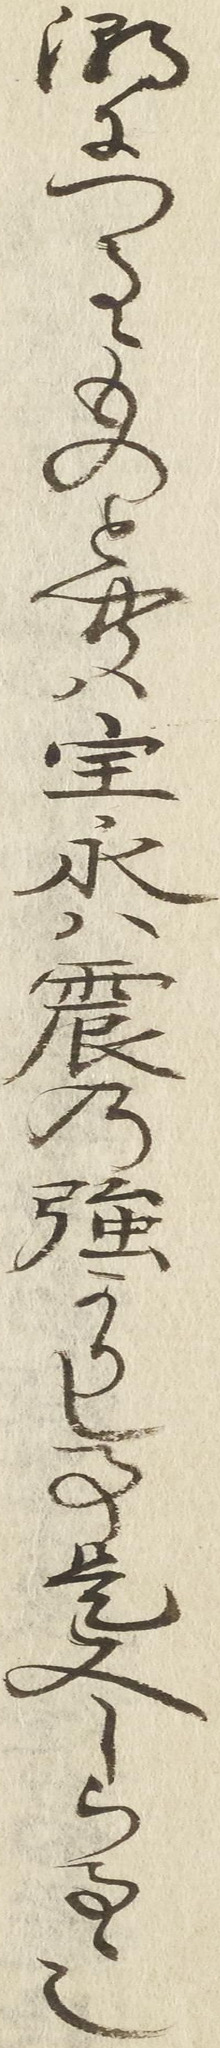潮につるゝものと聞ハ宝永ハ震の強かりし事是又しらるゝ也
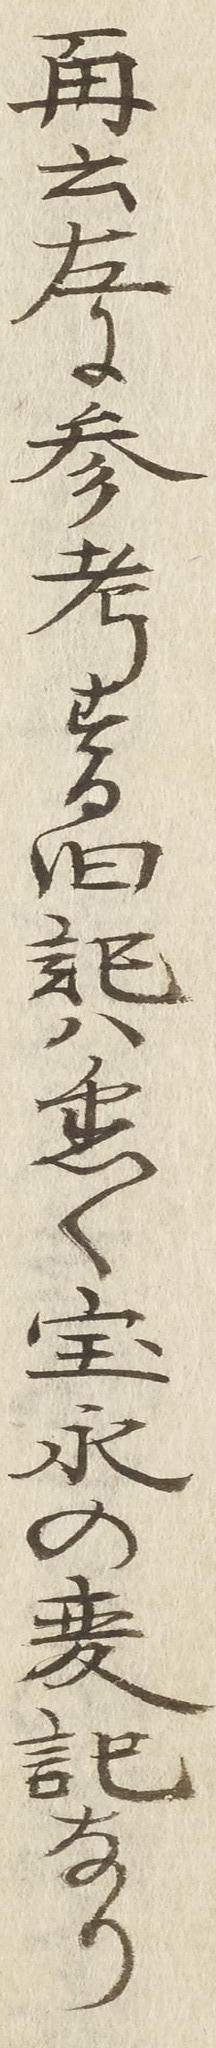再云左に参考する旧記ハ悉く宝永の変記なり
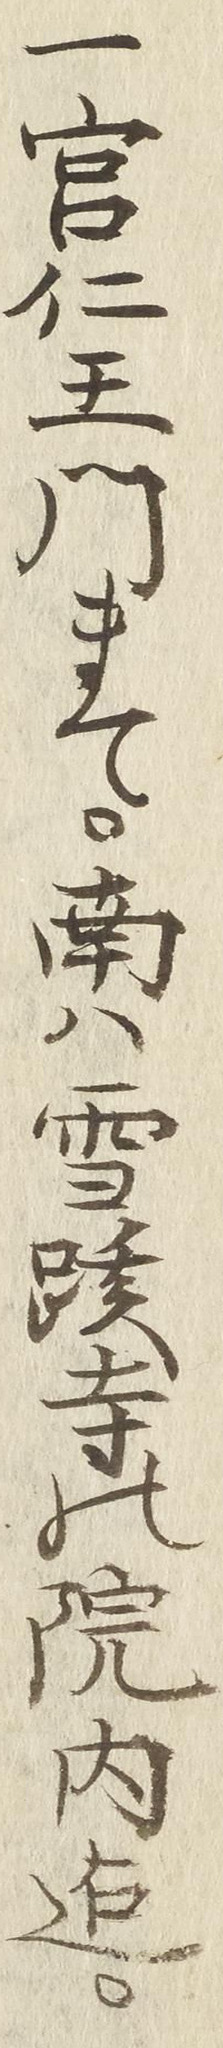一宮仁王門まて゜南ハ雪蹊寺の院内迄゜
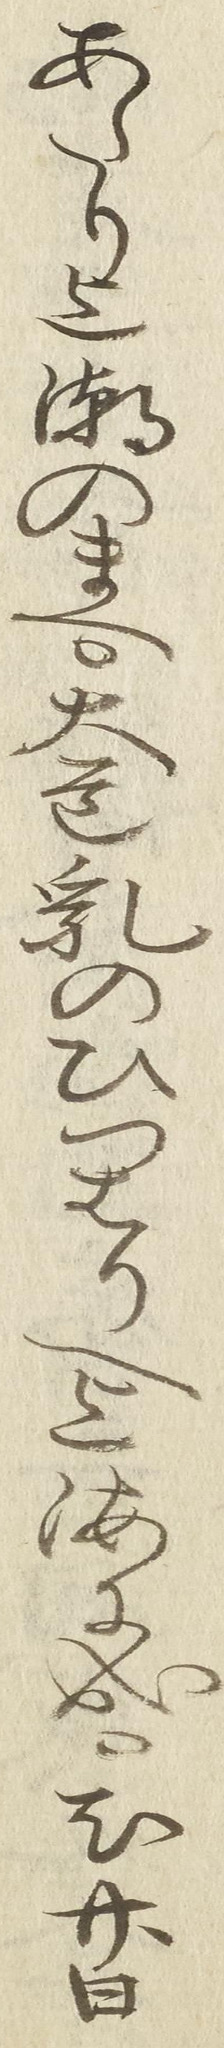あたり迄潮のまへ゜大道乳のひつはりへ迄海に成゜尤廿日
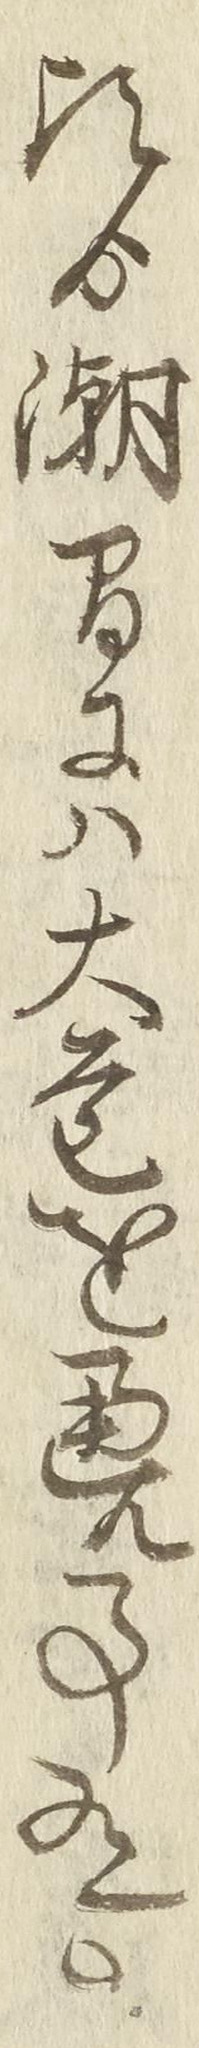頃ゟ潮間にハ大道を通ル事有゜

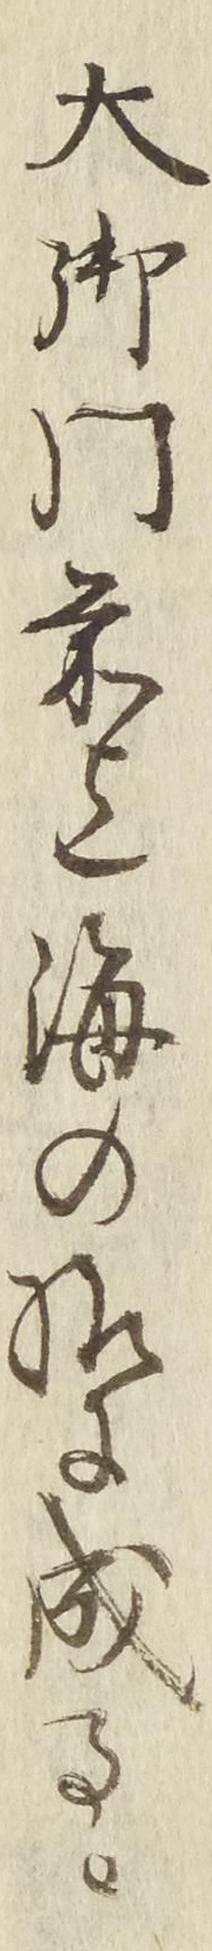大御門前迄海の様に成る◦
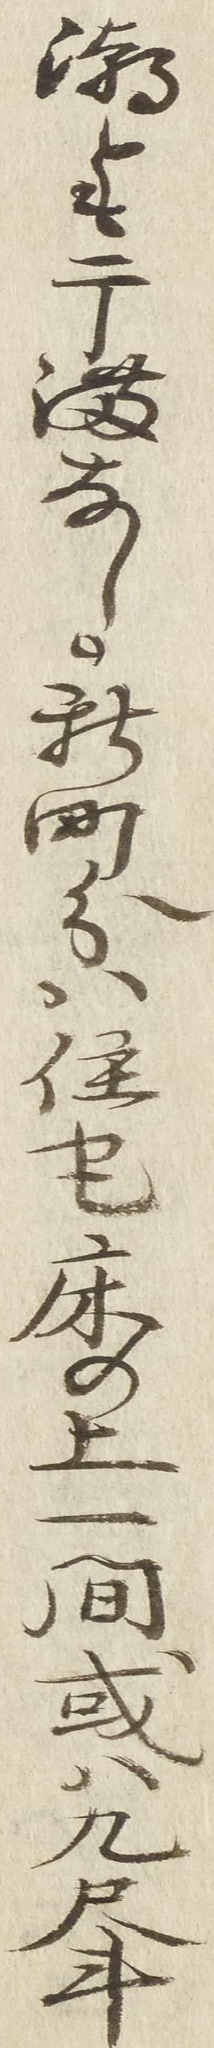潮とも干満なし◦新町分は住宅床の上一間或九尺斗
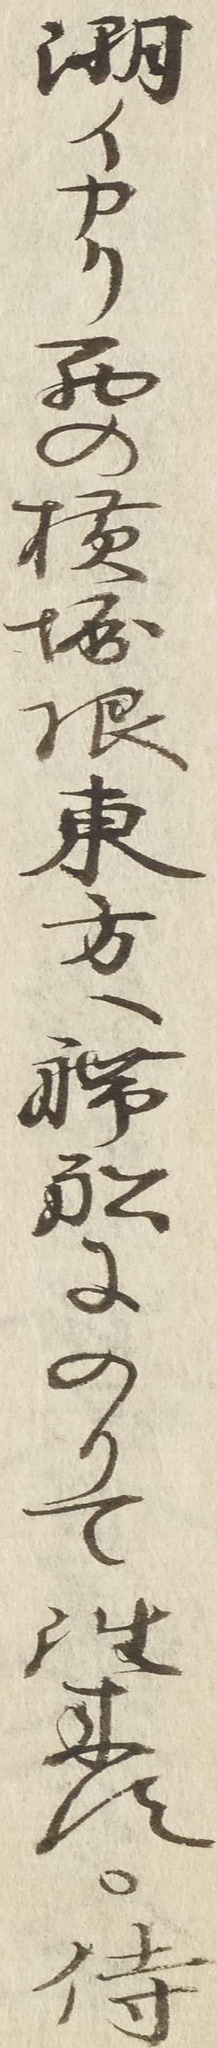潮イカリ西の横堀限東方へ艜船にのりて往来す◦侍
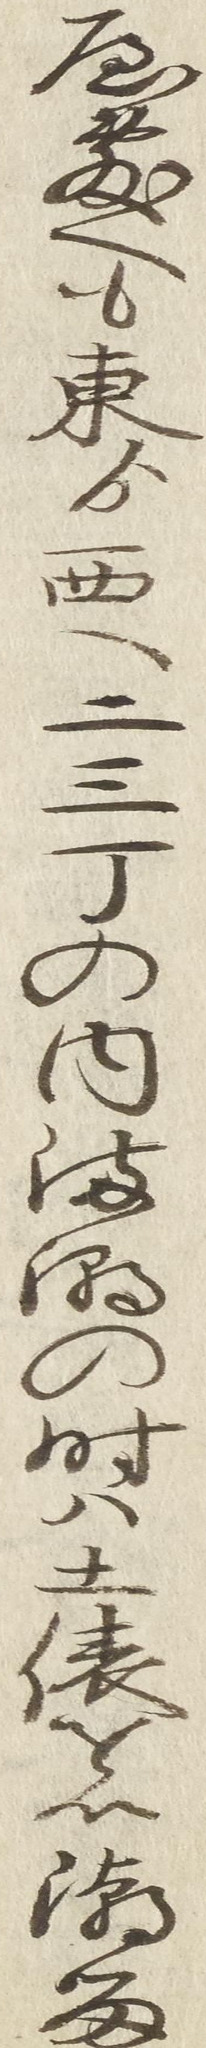屋敷へも東より西へ二三丁の内満潮の時は土俵を以潮留
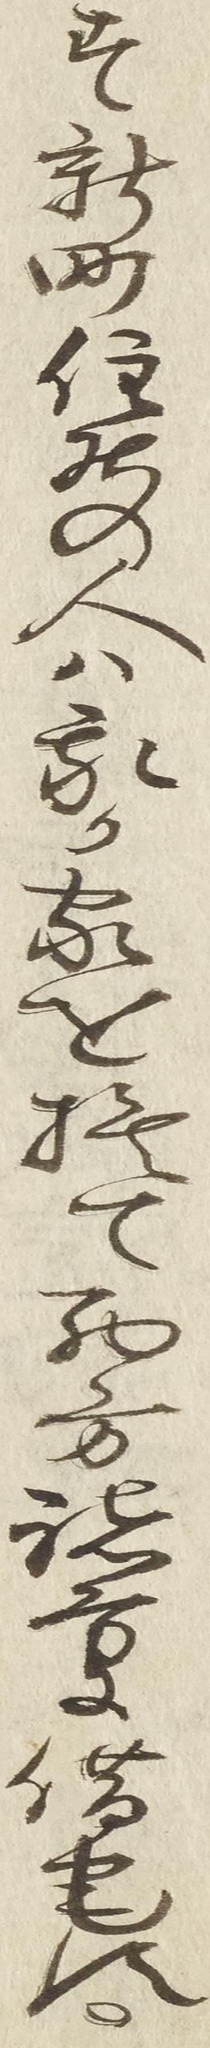す新町住居の人は我か家を捨て西方諸方に借宅す◦
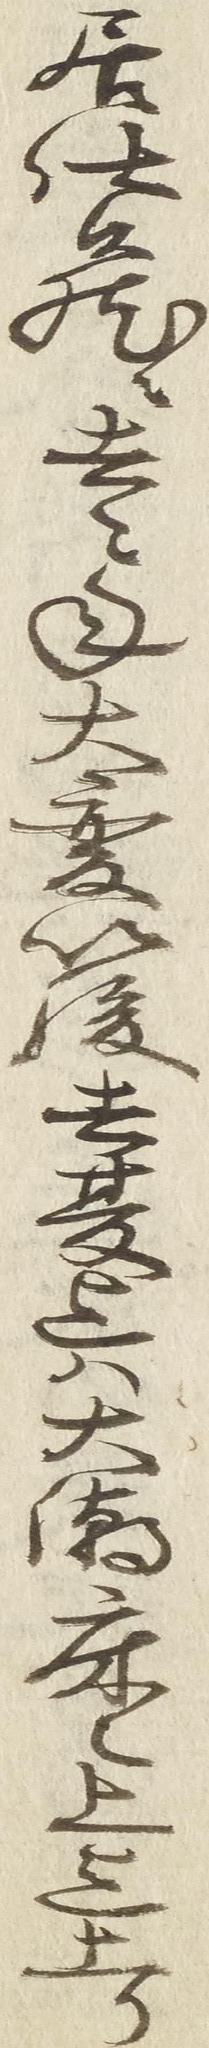居仕候然に去々年大変以後去夏迄は大潮床の上迄上り
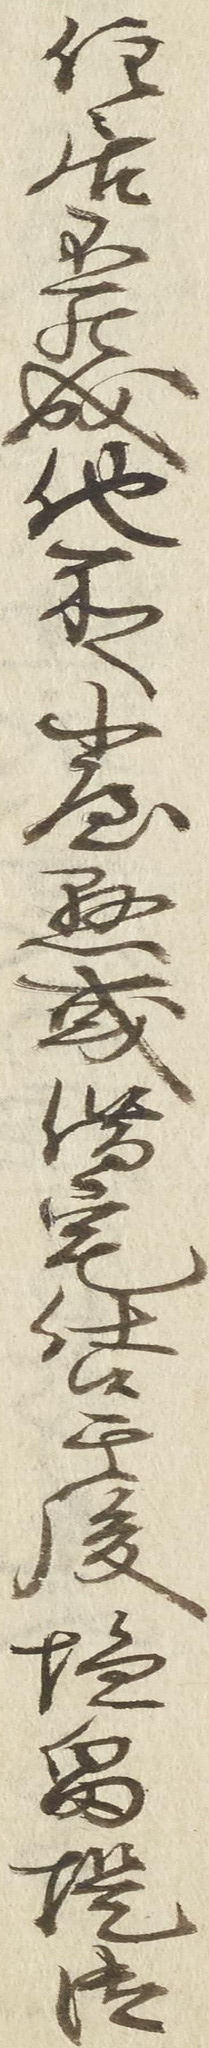住居不罷成他所へ小屋懸或借宅仕候其後塩畠堤御
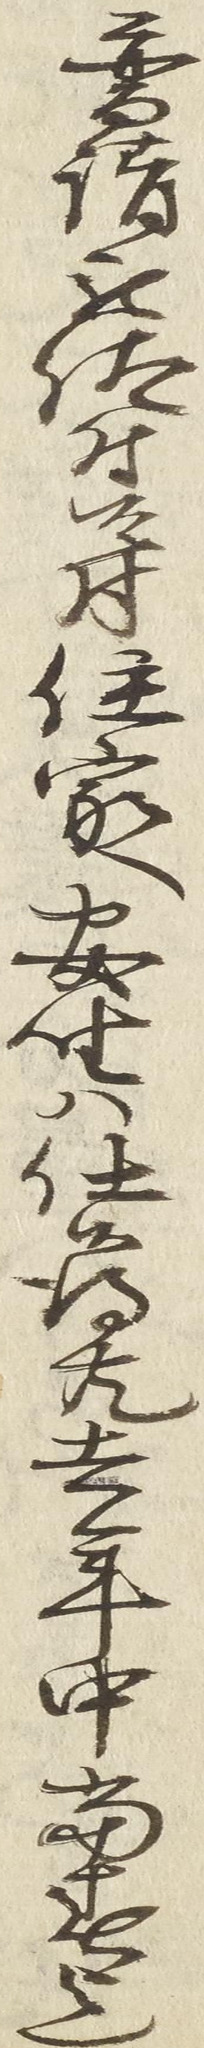普請被仰付候に付住家へ安座は仕候得共去年中当春迄
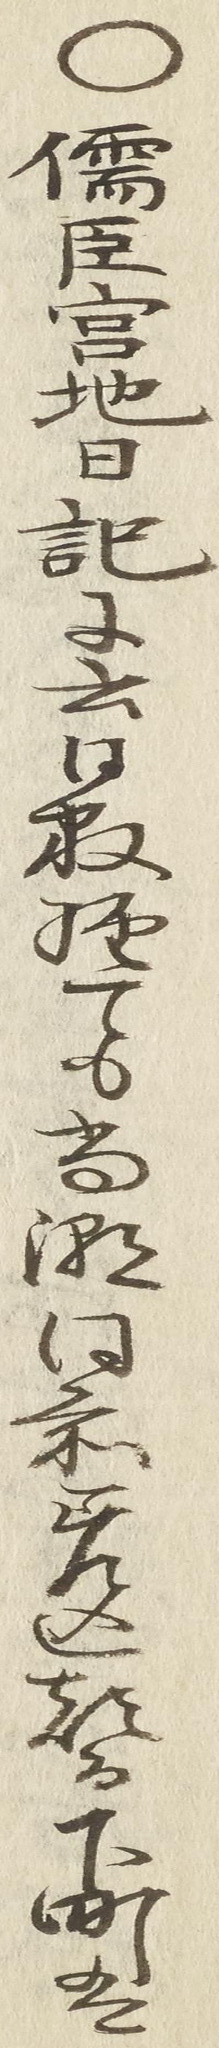〇儒臣宮地日記に云日数経ても尚潮同前差込都而下町有
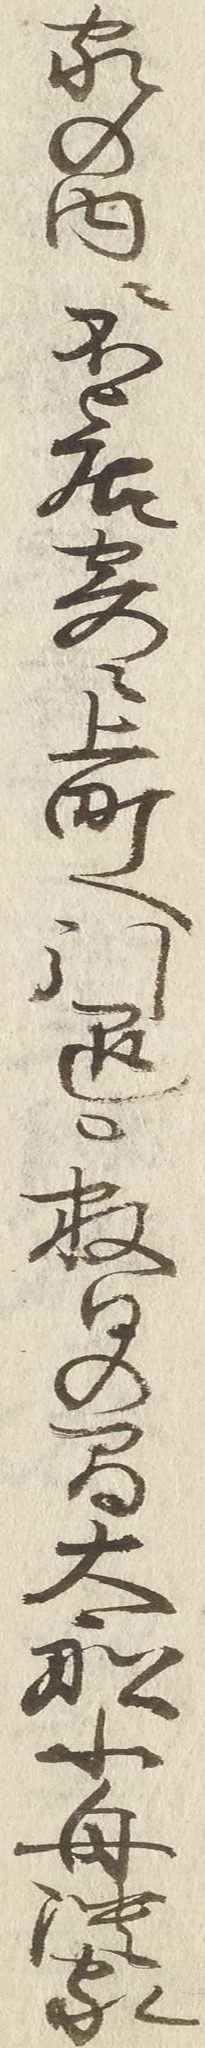家の内に不被居寄に上町へ引退◦数日の間大船小舟潰家
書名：地震記　上
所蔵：東京大学地震研究所図書室 Earthquake Research Institute Library, The University of Tokyo, JAPAN
